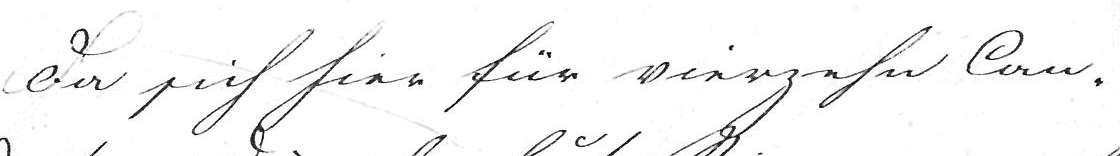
Da sich hier für vierzehn Can-
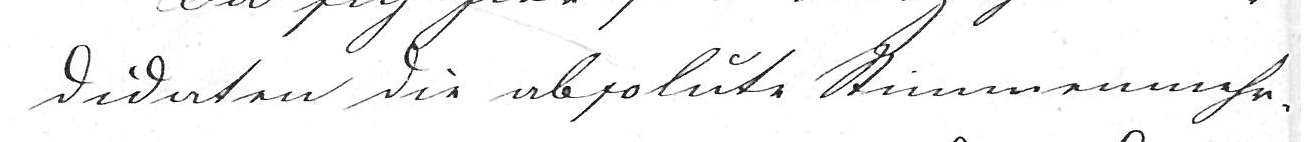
didaten die absolute Stimmenmehr-
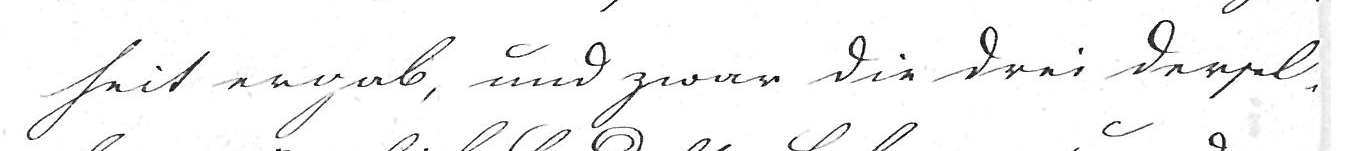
heit ergab, und zwar die drei dersel-
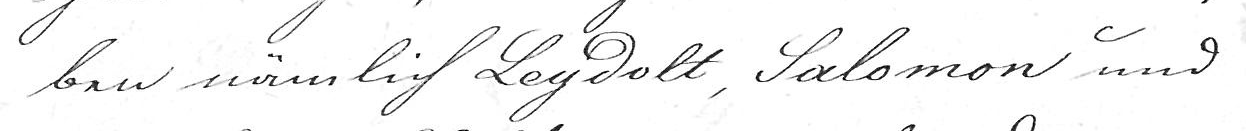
ben nämlich Leydolt, Salomon und
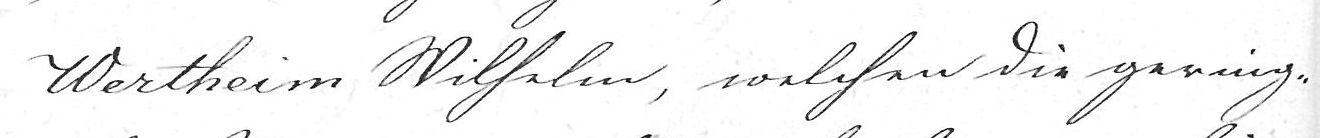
Wertheim Wilhelm, welchen die gering-
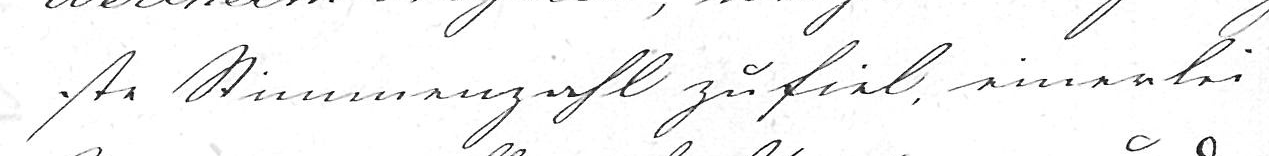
ste Stimmenzahl zufiel, einerlei
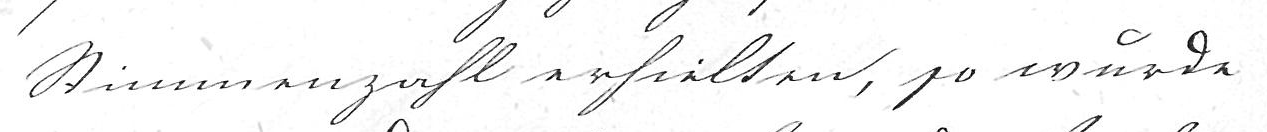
Stimmenzahl erhielten, so wurde
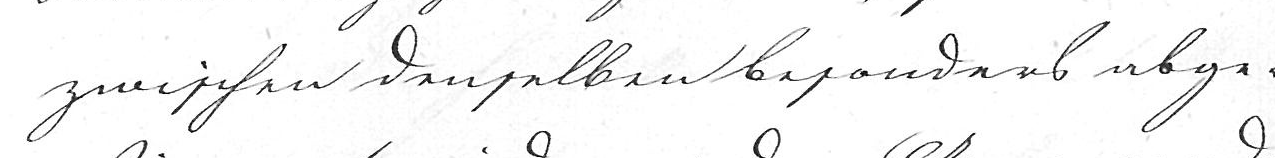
zwischen denselben besonders abge-
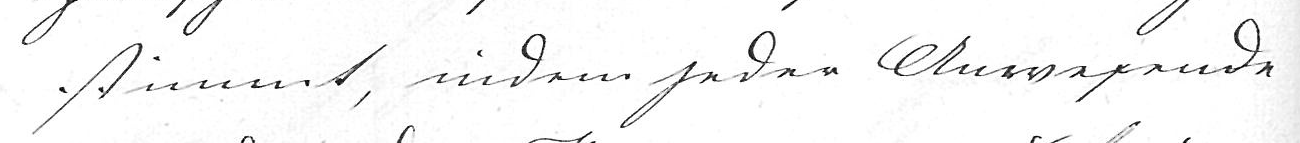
stimmt, indem jeder Anwesende
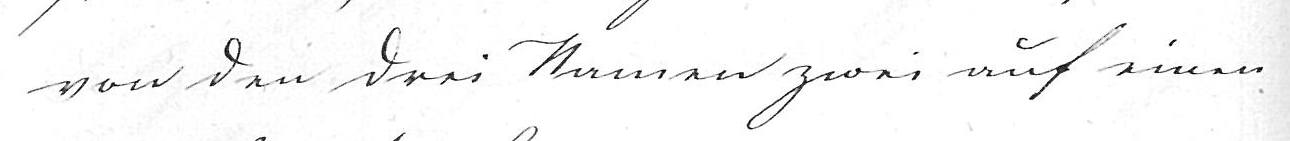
von den drei Namen zwei auf einen
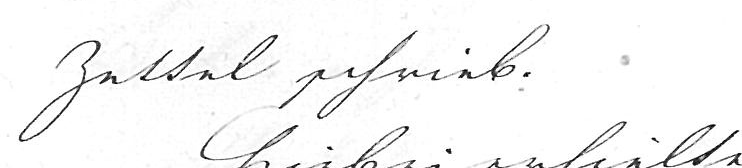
Zettel schrieb.
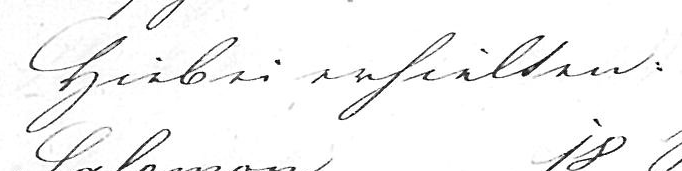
Hiebei erhielten:
